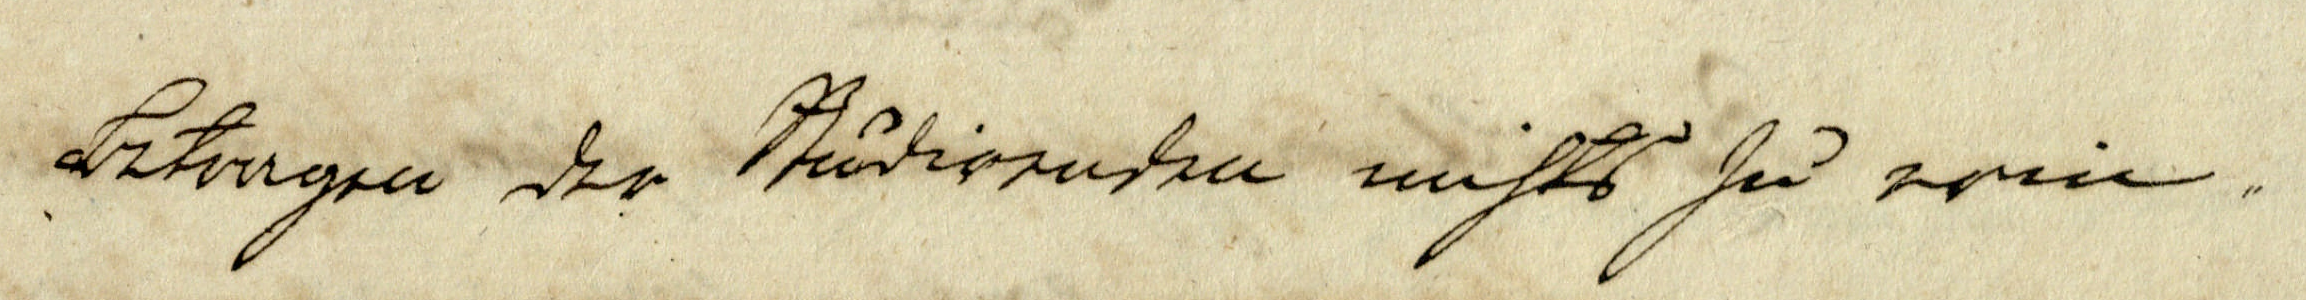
Betragen der Studirenden nichts zu erin¬
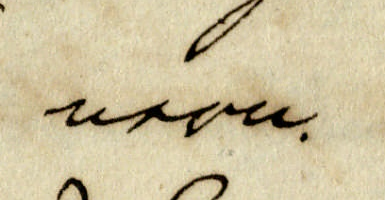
nern.
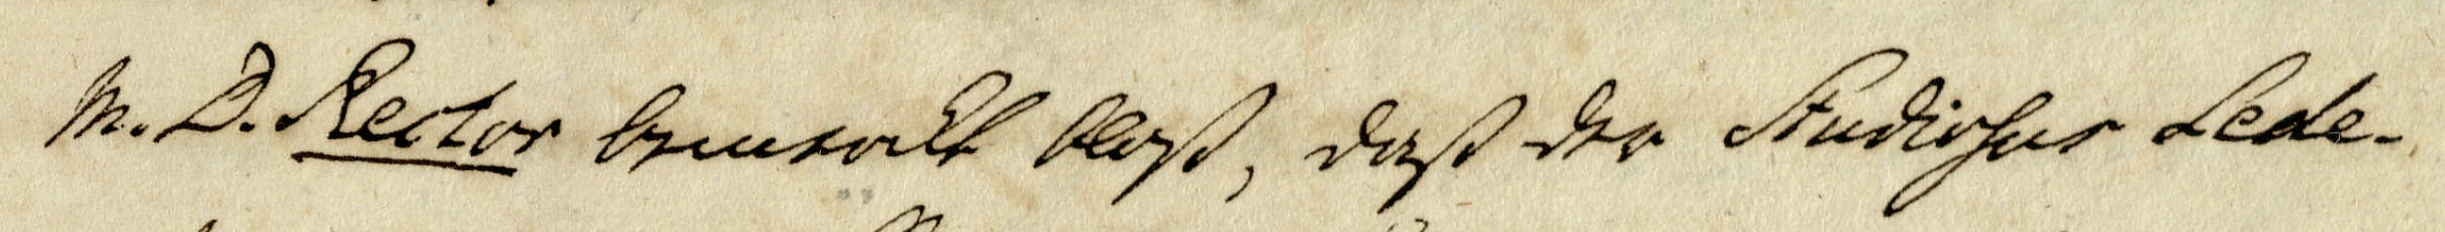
M. D. Rector bemerckt bloß, daß der Studiosus Lede¬
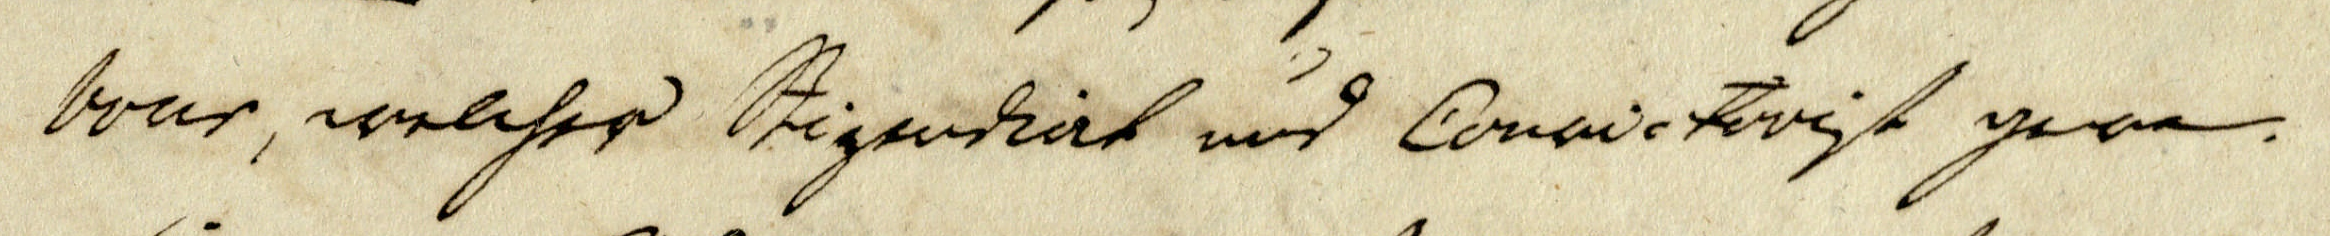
bour, welcher Stipendiat und Convictorist gewe¬
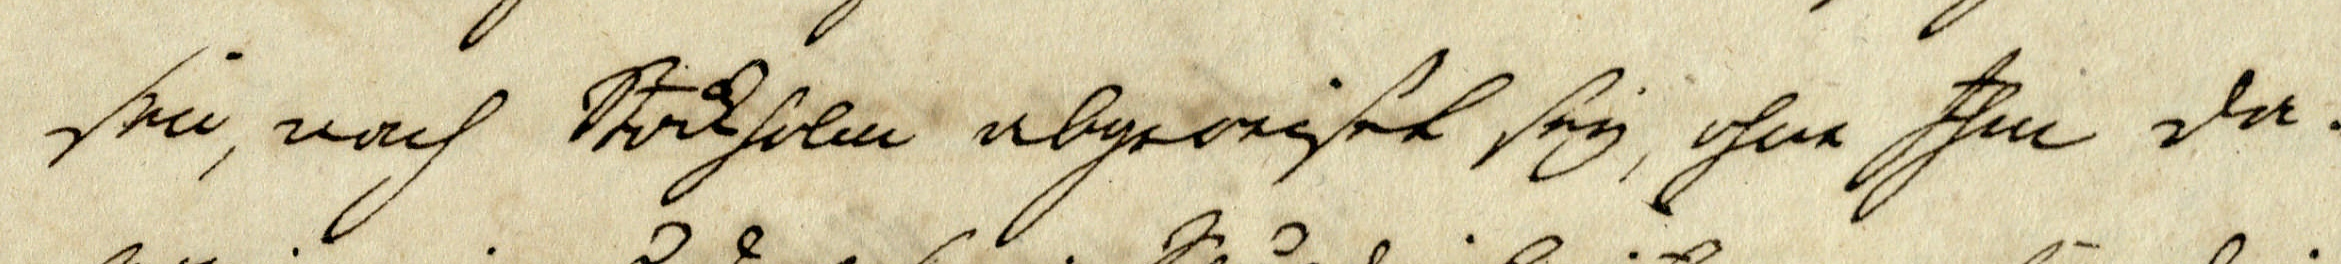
sen, nach Stockholm abgereiset seÿ, ohne Ihm da¬
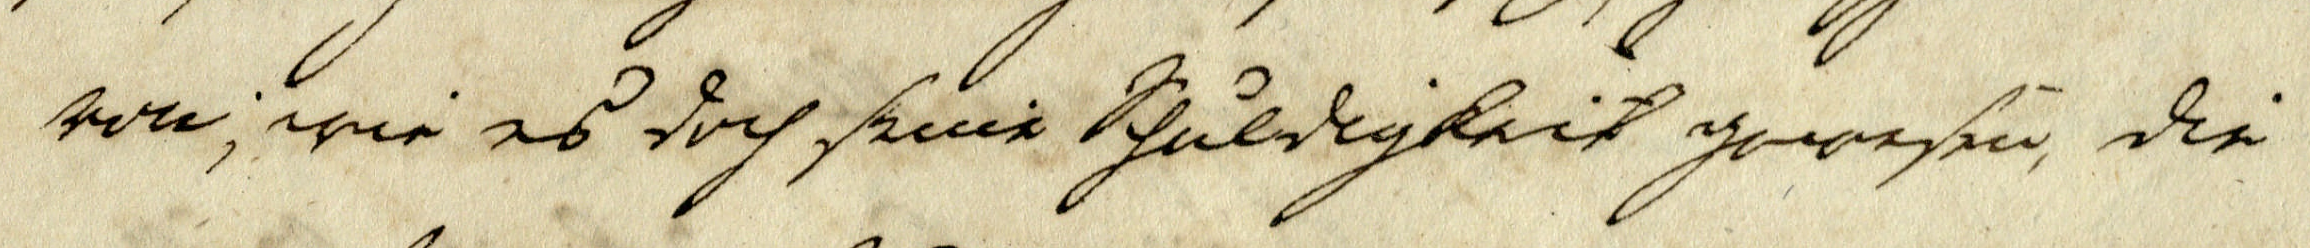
von; wie es doch seine Schuldigkeit gewesen, die
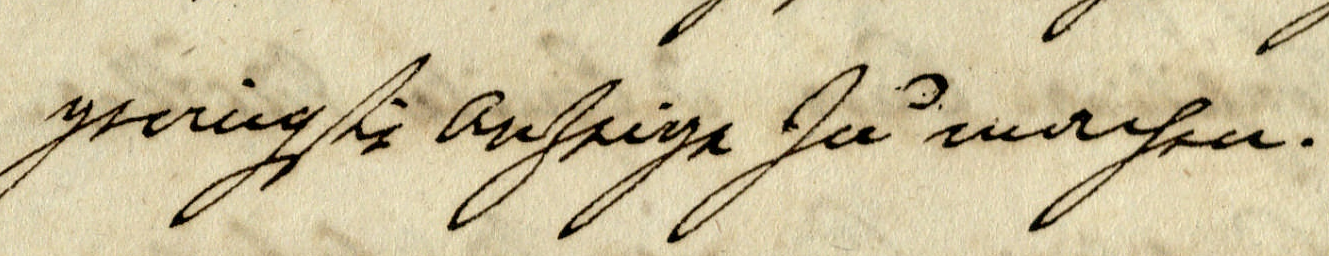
geringste Anzeige zu machen.
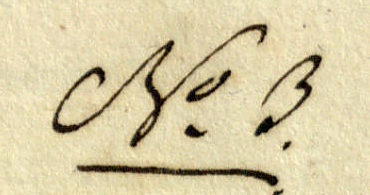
No 3.
